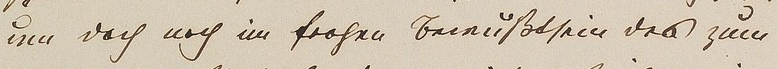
um doch noch im frohen Bewußtsein des zum
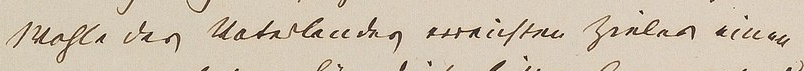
Wohle des Vaterlandes erreichten Zieles einen
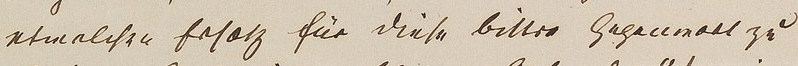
etwelchen Ersatz für diese bittre Gegenwart zu
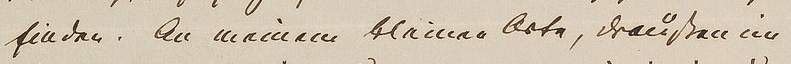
finden. An meinem kleinen Orte, draußen im
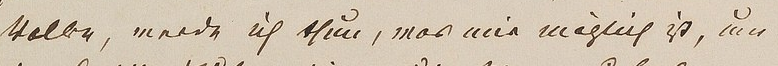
Volke, werde ich thun, was mir möglich ist, um
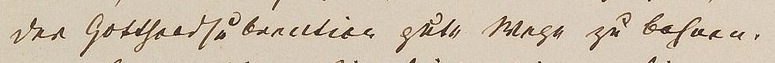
der Gotthardsubvention gute Wege zu bahnen.
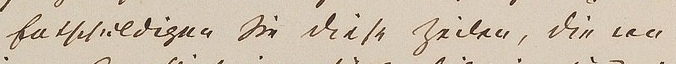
Entschuldigen Sie diese Zeilen, die von
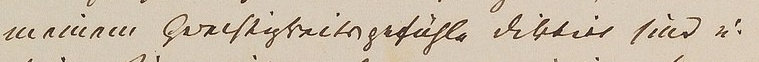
meinem Gerechtigkeitsgefühle diktirt sind u.
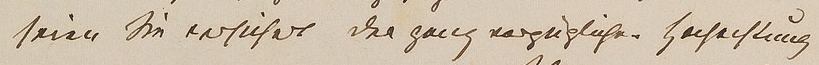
seien Sie versichert der ganz vorzüglichen Hochachtung
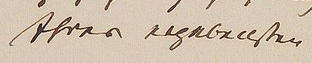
Ihres ergebensten
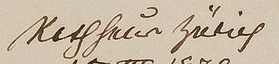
Rathhaus Zürich
